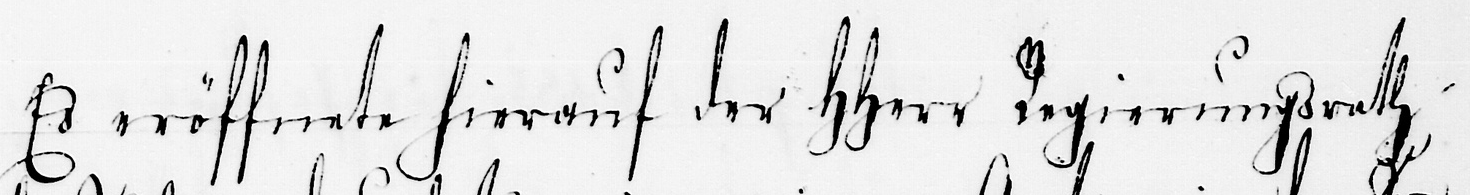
Es eröffnete Hierauf der HHerr Regierungsrath
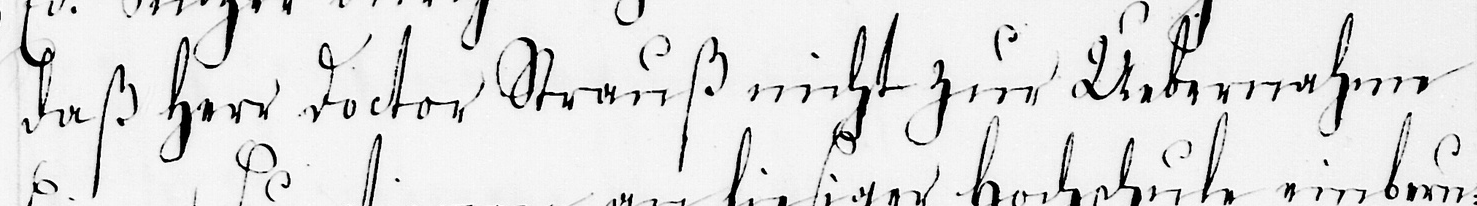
daß Herr Doctor Strauß nicht zur Uebernahme
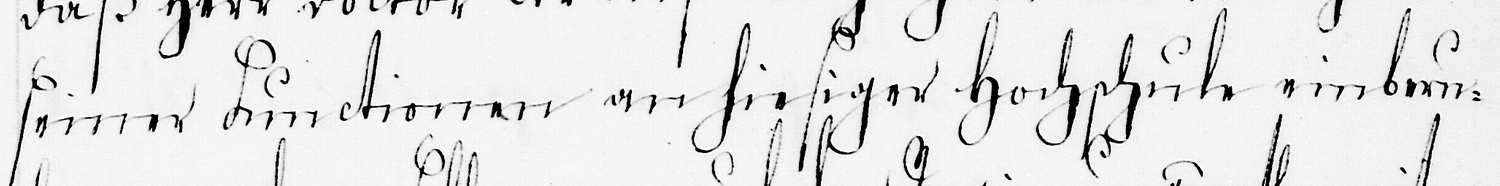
seiner Functionen an hiesiger Hochschule einberu¬
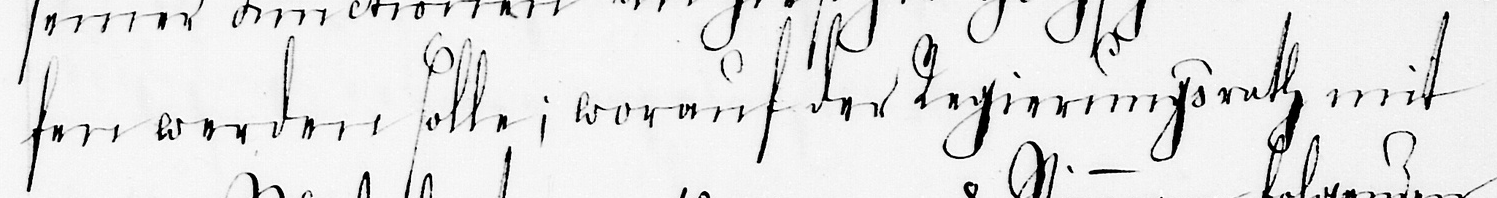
fen werden solle; worauf der Regierungsrath mit
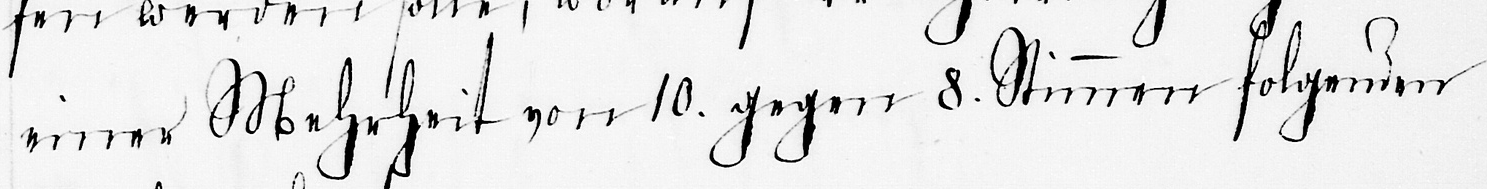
einer Mehrheit von 10. gegen 8. Stimmen folgenden
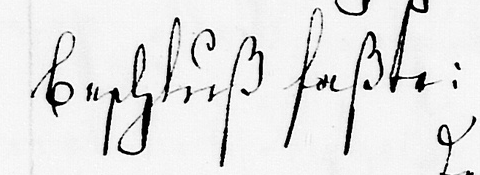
Beschluß faßte:
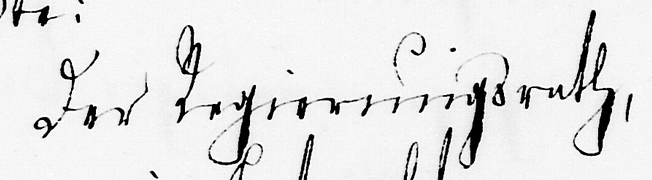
Der Regierungsrath,
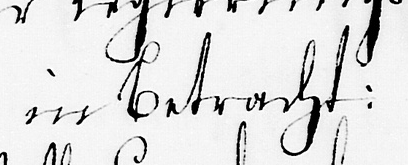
in Betracht:
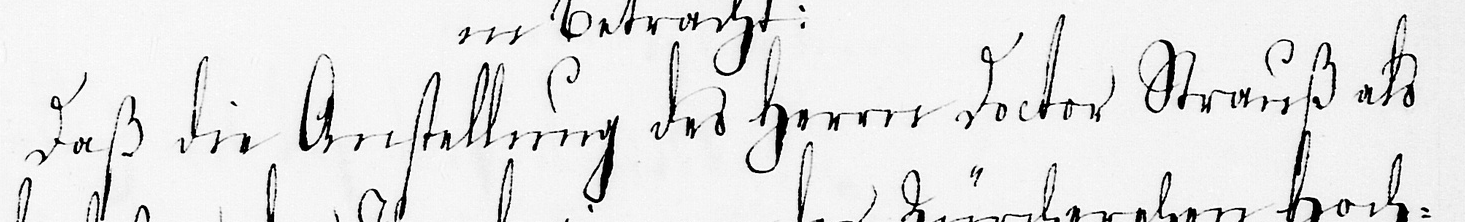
Daß die Anstellung des Herrn Doctor Strauß als
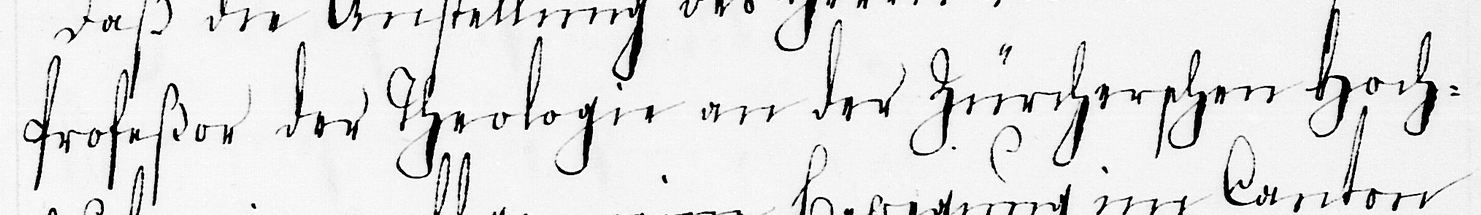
Profeßor der Theologie an der Zürcherschen Hoch¬
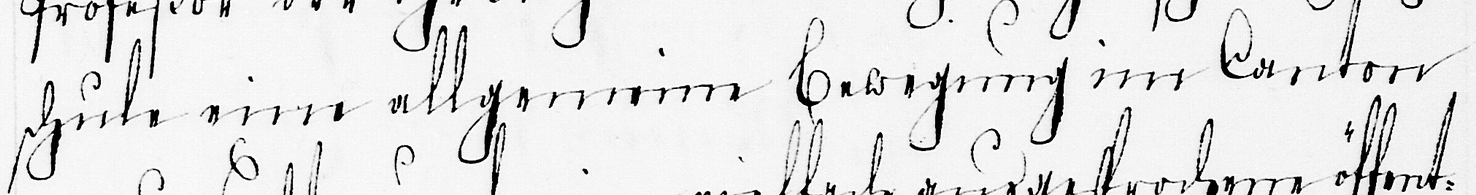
schule eine allgemeine Bewegung im Canton
